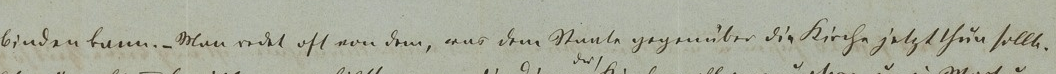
binden kann. – Man redet oft von dem, was dem Staate gegenüber die Kirche jetzt thun sollte.
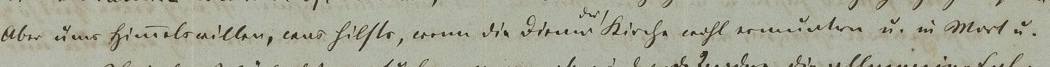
Aber ums Himmelswillen, was hilfts, wenn die Diener der Kirche wohl ermuntern u. in Wort u.
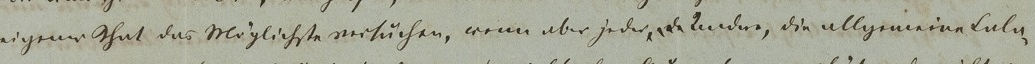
eigener That das Möglichste versuchen, wenn aber jeder , de Andere, die allgemeine Cala-
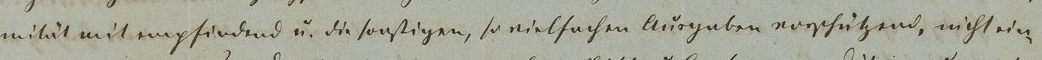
mität mit empfindend u. die sonstigen, so vielfachen Ausgaben vorschützend, nicht ein-
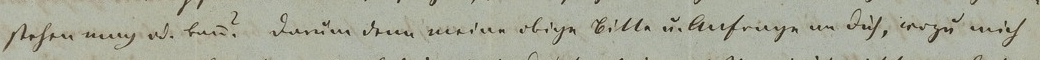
stehen mag od. kann? Darum denn meine obigen Bitte u. Anfrage an Dich, wozu mich
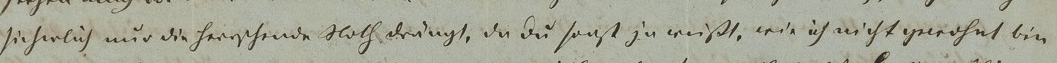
sicherlich nur die herrschende Noth drängt, da Du sonst ja weißt, wie ich nicht gewohnt bin
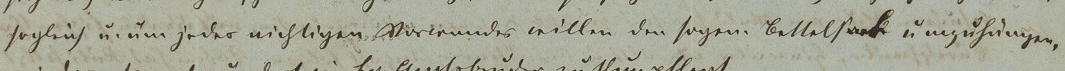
sogleich u. um jedes nichtigen Vorwandes willen den sogen. Bettelsack umzuhängen,
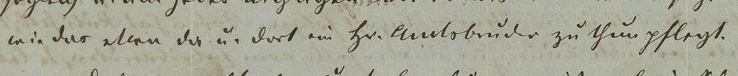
wie das etwa da u. dort ein Hr. Amtsbruder zu thun pflegt.
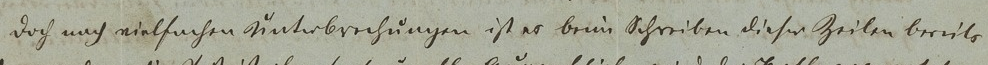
Doch nach vielfachen Unterbrechungen ist es beim Schreiben dieser Zeilen bereits
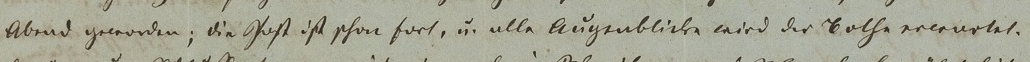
Abend geworden; die Post ist schon fort, u. alle Augenblicke wird der Bothe erwartet.
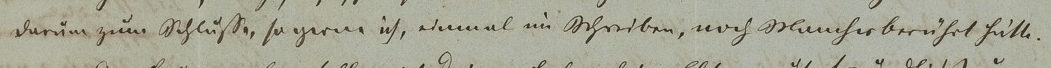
Darum zum Schlusse, so gerne ich, einmal im Schreiben, noch Manches berührt hätte.
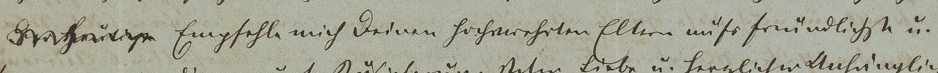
Der heutige Empfehle mich Deinen hochverehrten Eltern aufs freundlichste u.
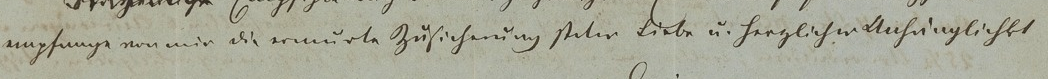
empfange von mir die erneurte Zusicherung steter Liebe u. herzlicher Anhänglichkt
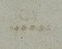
Dein
